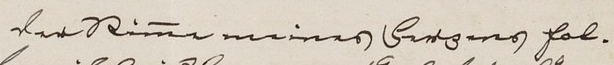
Der Stimme meines Herzens fol-
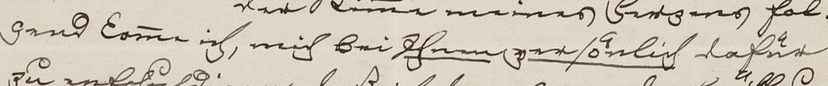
gend komme ich, mich bei Ihnenpersönlich dafür
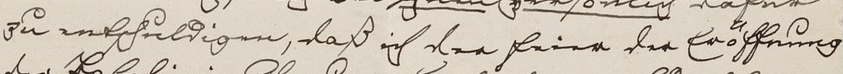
zu entschuldigen, daß ich der Feier der Eröffnung
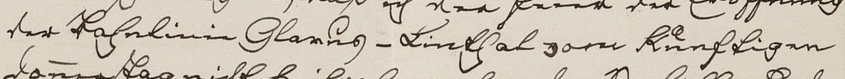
der Bahnlinie Glarus–Linthal vom künftigen
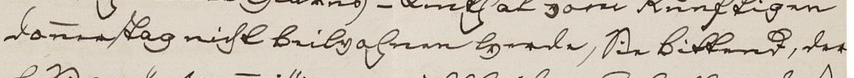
Donnerstag nicht beiwohnen werde, Sie bittend, der
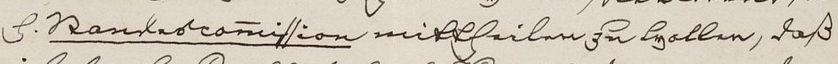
H. Standescommission mittheilen zu wollen, daß
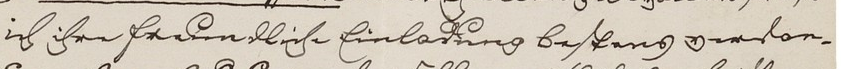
ich ihre freundliche Einladung bestens verdan-
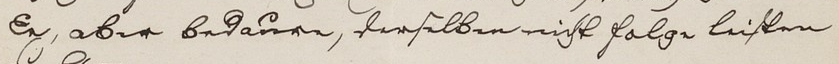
ke, aber bedaure, derselben nicht Folge leisten
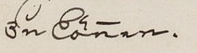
zu können.
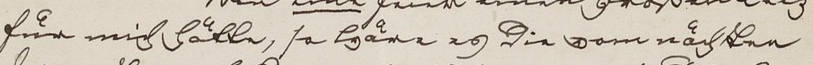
für mich hätte, so wäre es die vom nächsten
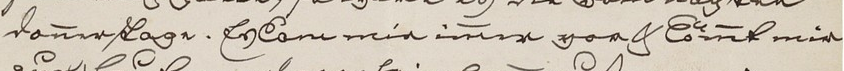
Donnerstage. Es kam mir immer vor & kömmt mir
